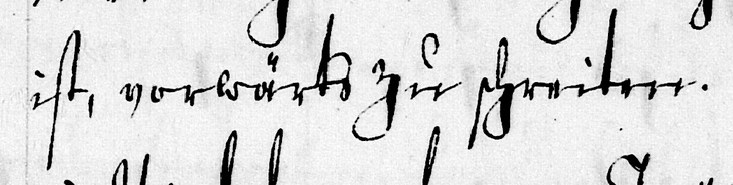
ist, vorwärts zu schreiten.
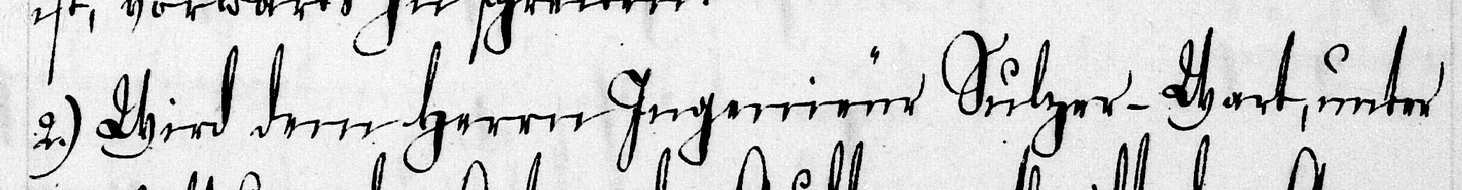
2.) Wird dem Herrn Ingenieur Sulzer-Wart, unter
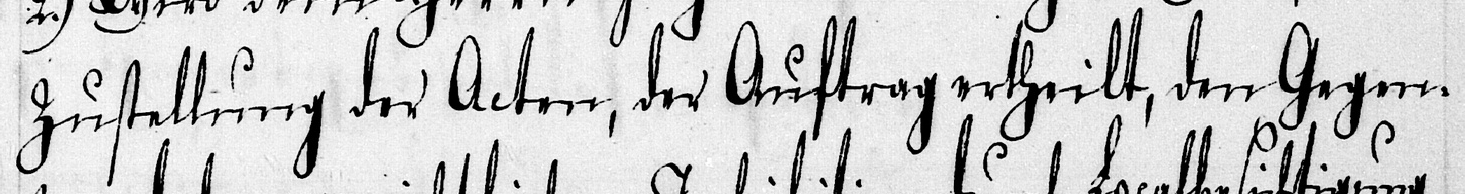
Zustellung der Acten, der Auftrag ertheilt, den Gegen¬
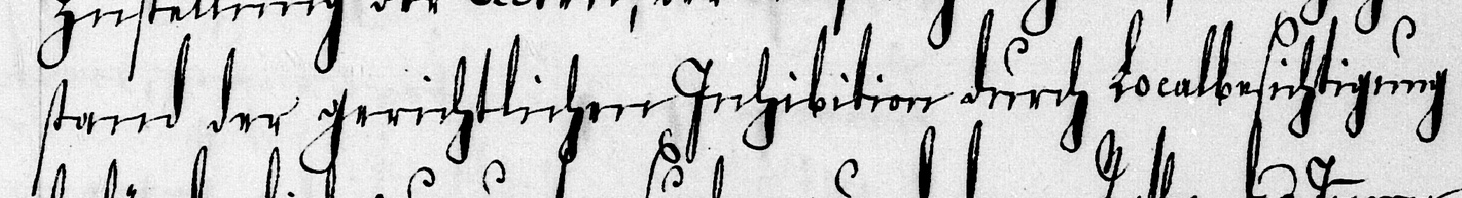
stand der gerichtlichen Inhibition durch Localbesichtigung
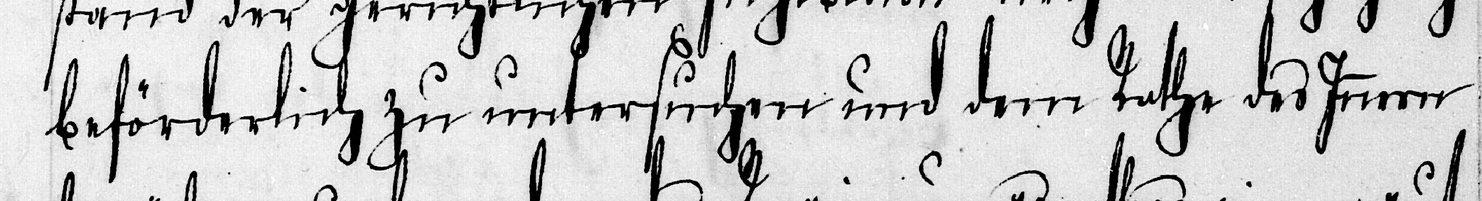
beförderlich zu untersuchen und dem Rathe des Innern
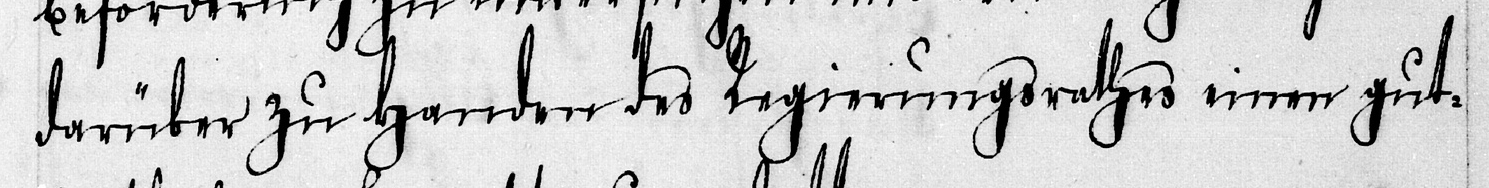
darüber zu Handen des Regierungsrathes einen gut¬
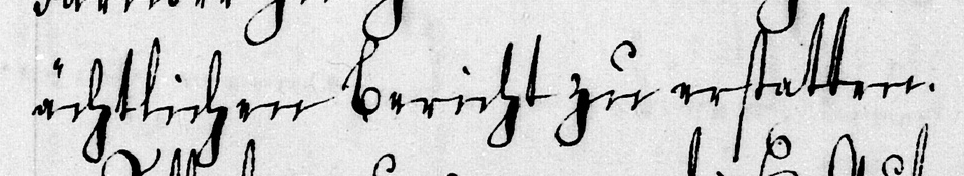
ächtlichen Bericht zu erstatten.
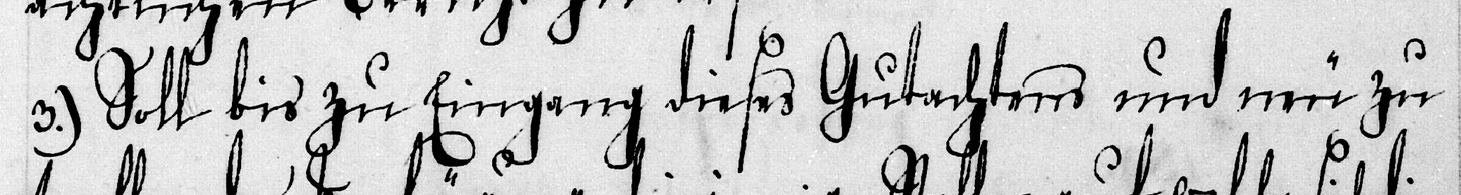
3.) Soll bis zu Eingang dieses Gutachtens und neu zu
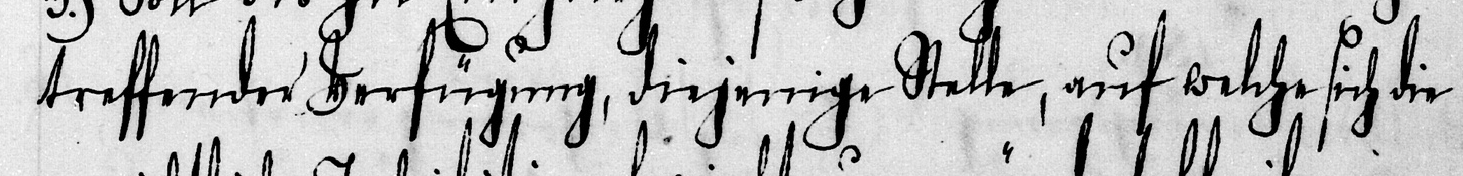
treffender Verfügung, diejenige Stelle, auf welche sich die
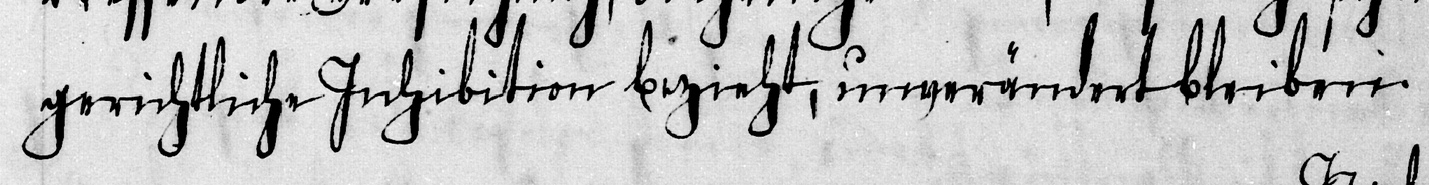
gerichtliche Inhibition bezieht, unverändert bleiben.
